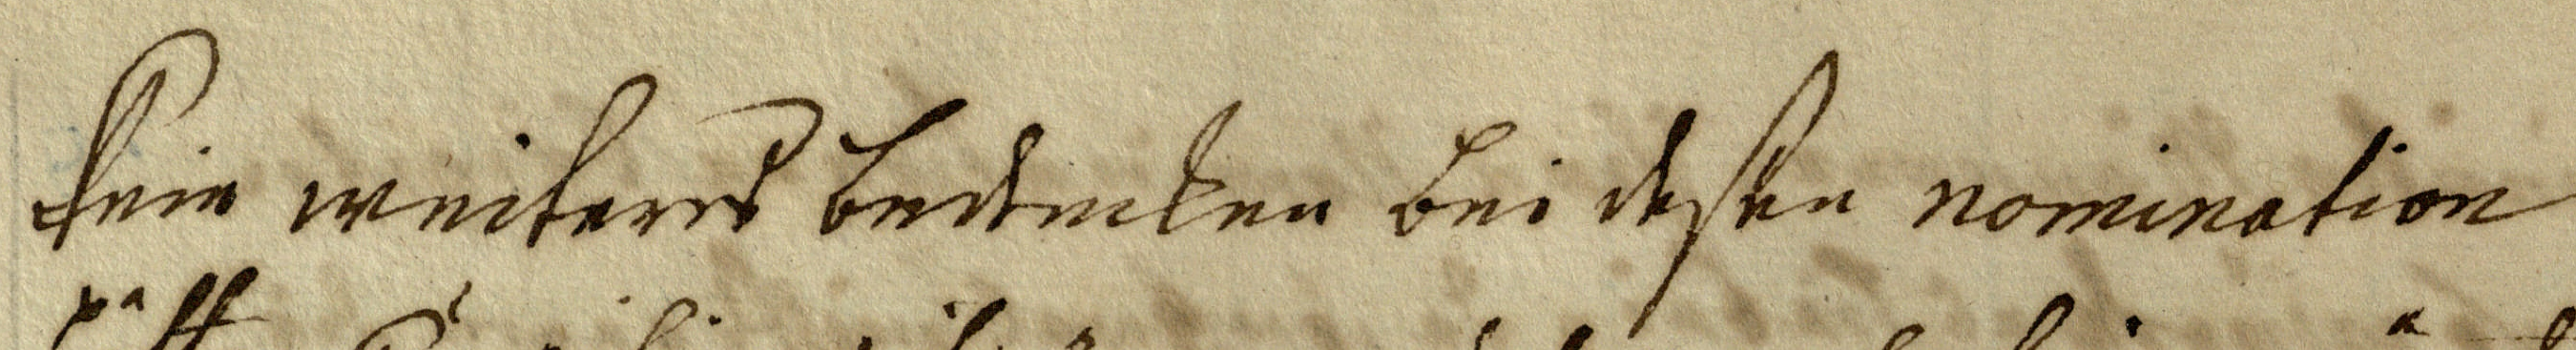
kein weiteres Bedenken bei deßen nomination
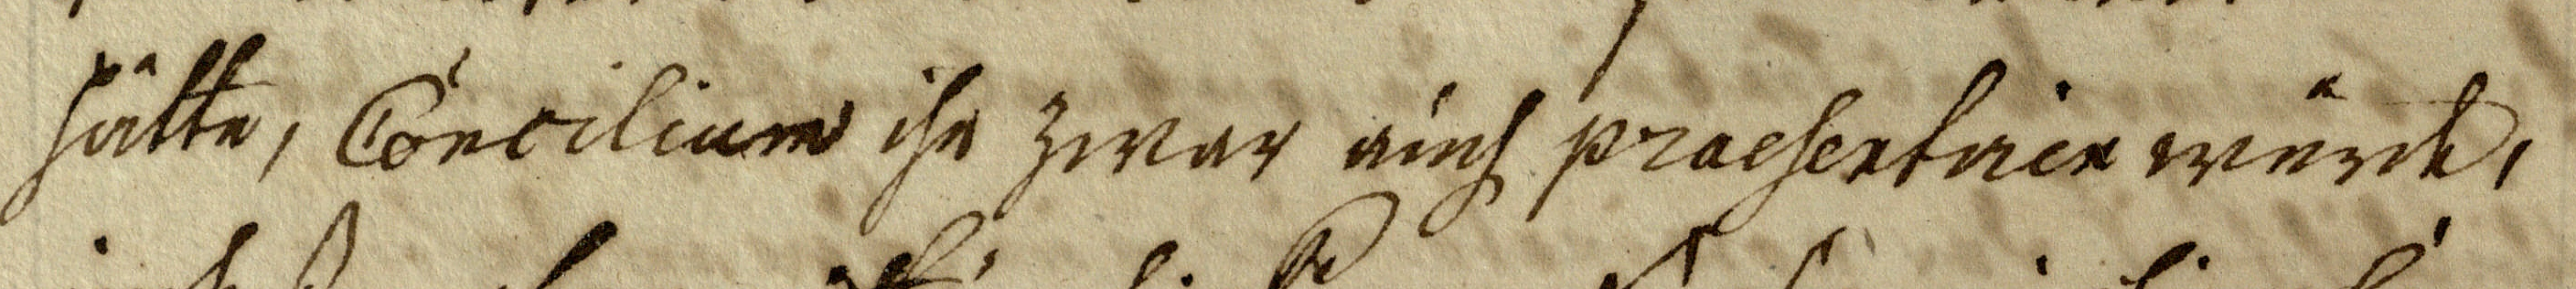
hätte, Concilium ihn zwar auch praesentiren würde,
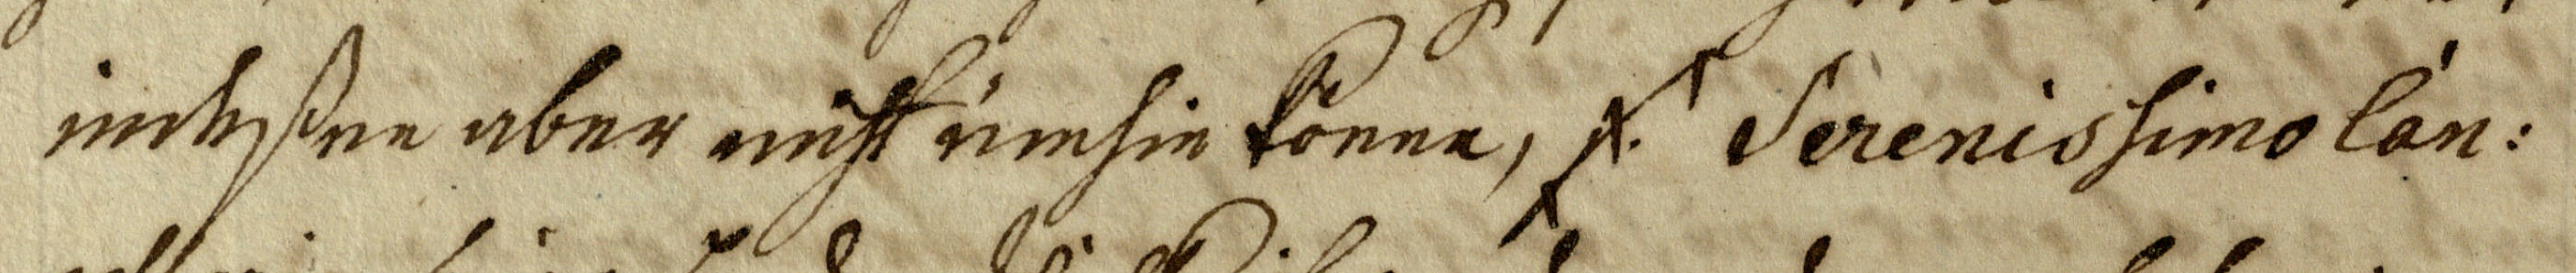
indeßen aber nicht umhin könne, Serenissimo Can¬
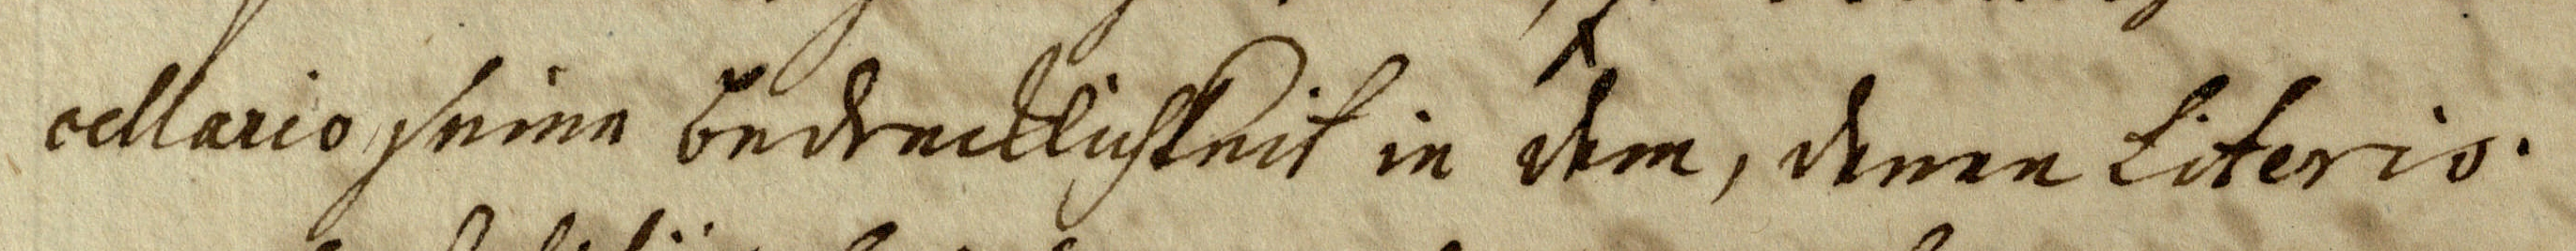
cellario seine Bedenklichkeit in dem, denen Literis
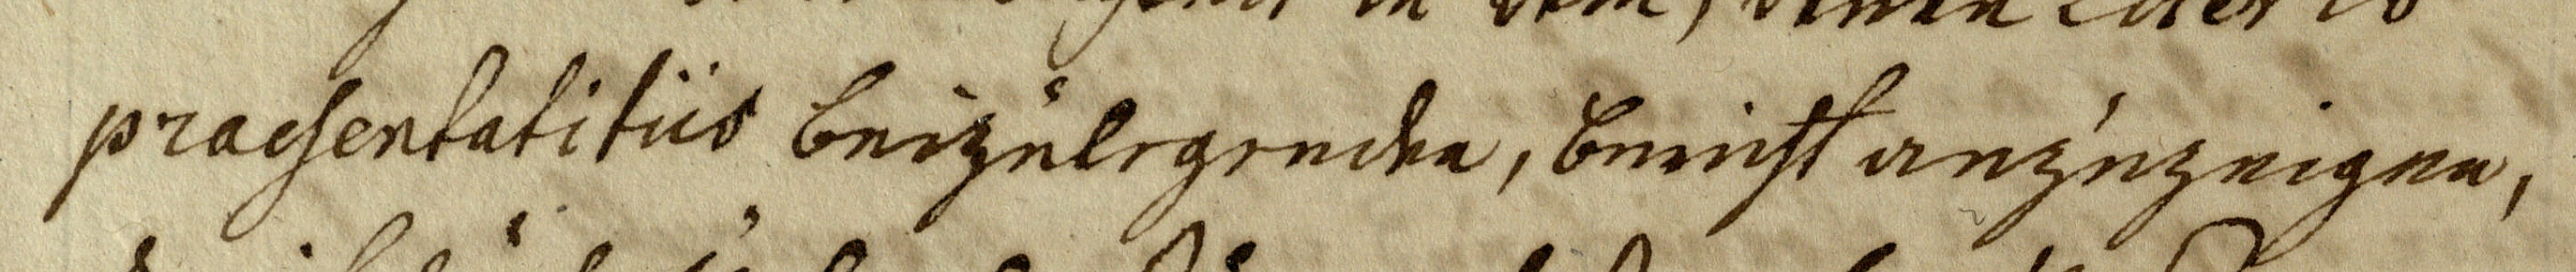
praesentatitiis beizulegenden, Bericht anzuzeigen,
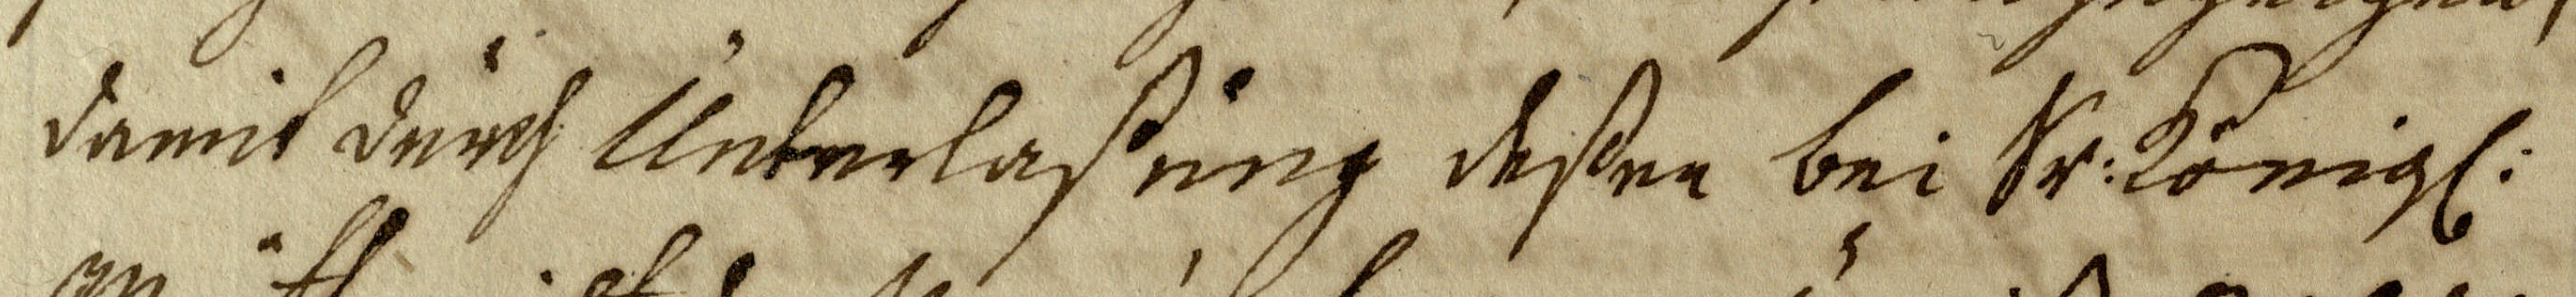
damit durch Unterlaßung deßssen bei Sr Königl.
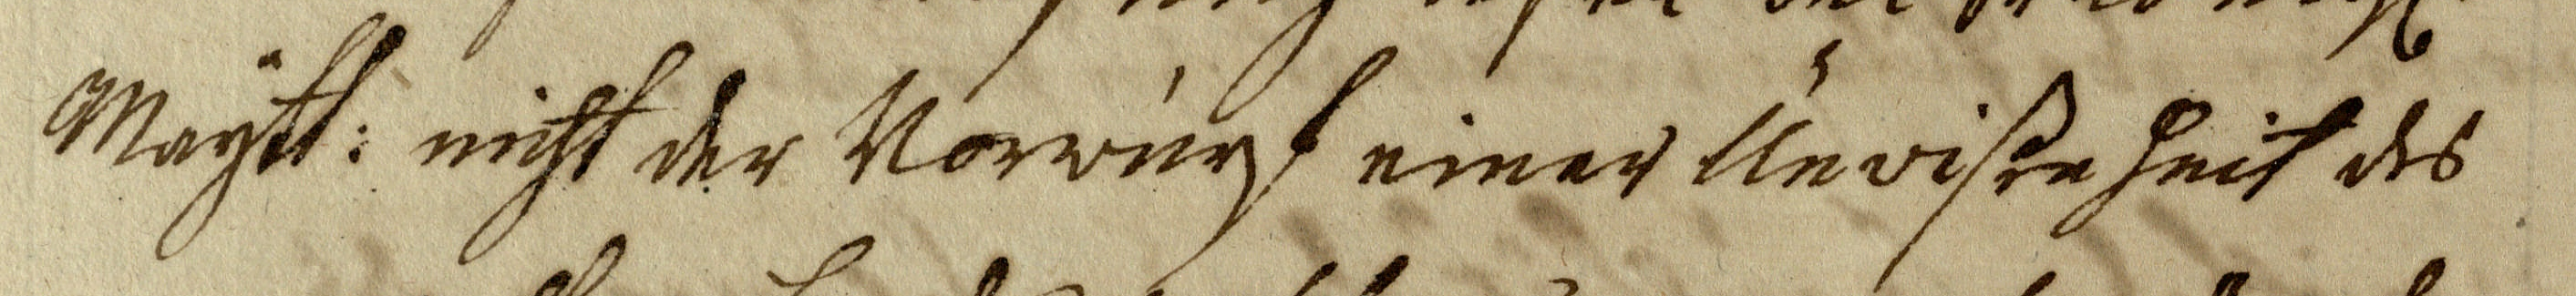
Maÿtt. nicht der Vorwurf einer Unwißenheit des
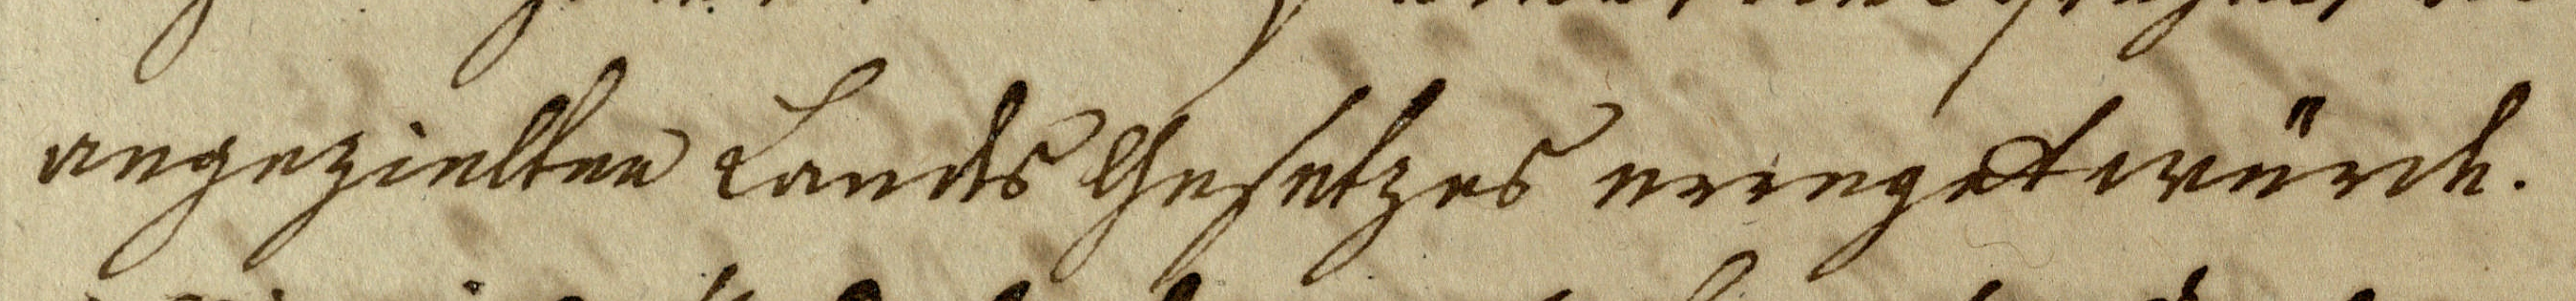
angezielten Landes Gesetzes erreget würde.
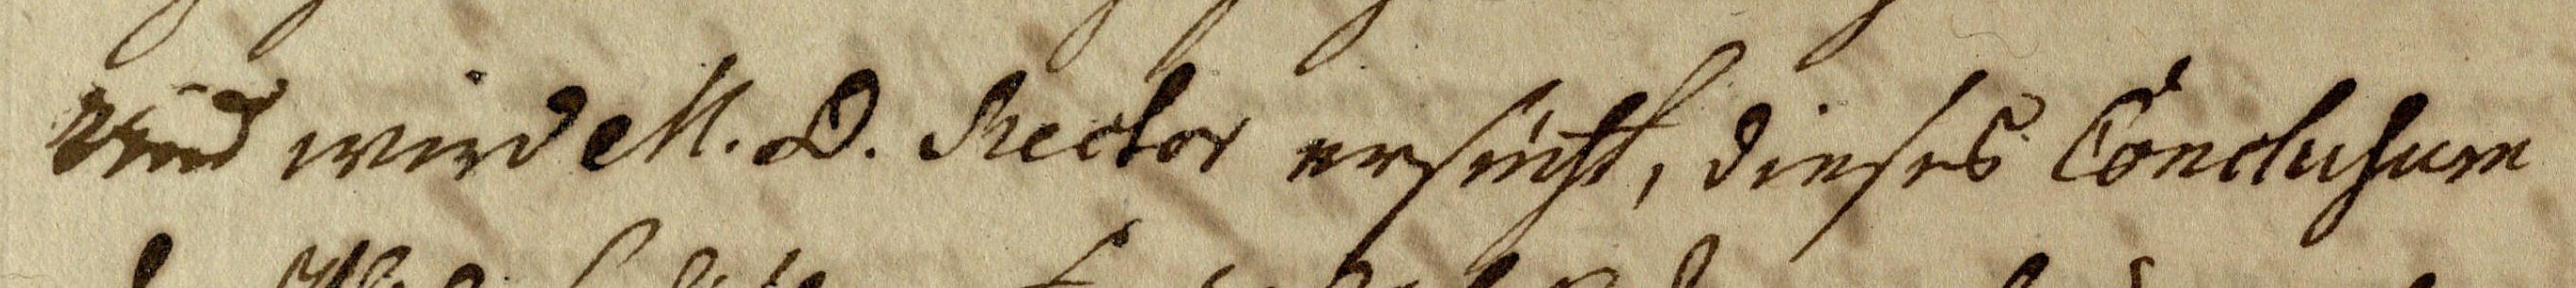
Und wird M. D. Rector ersucht, dieses Conclusum
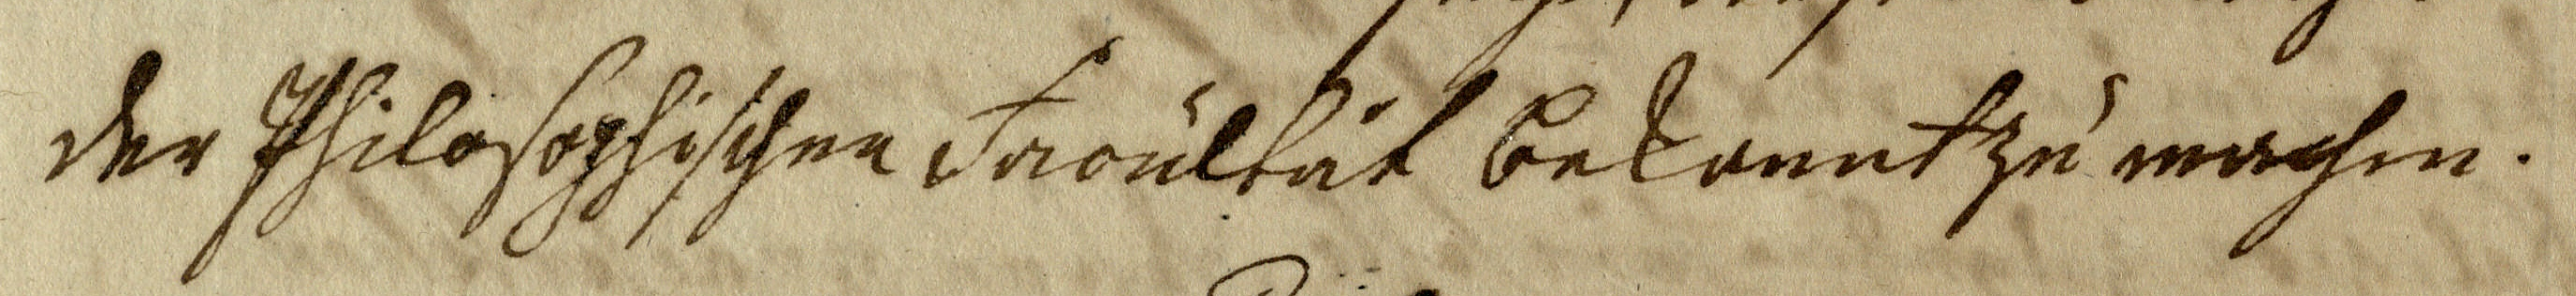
der Philosophischen Facultät bekannt zu machen.
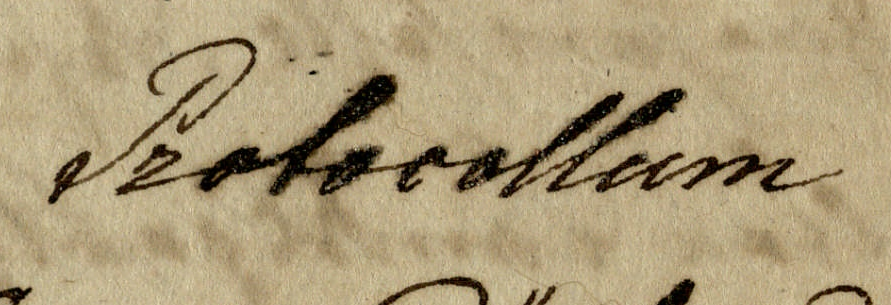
Protocollum
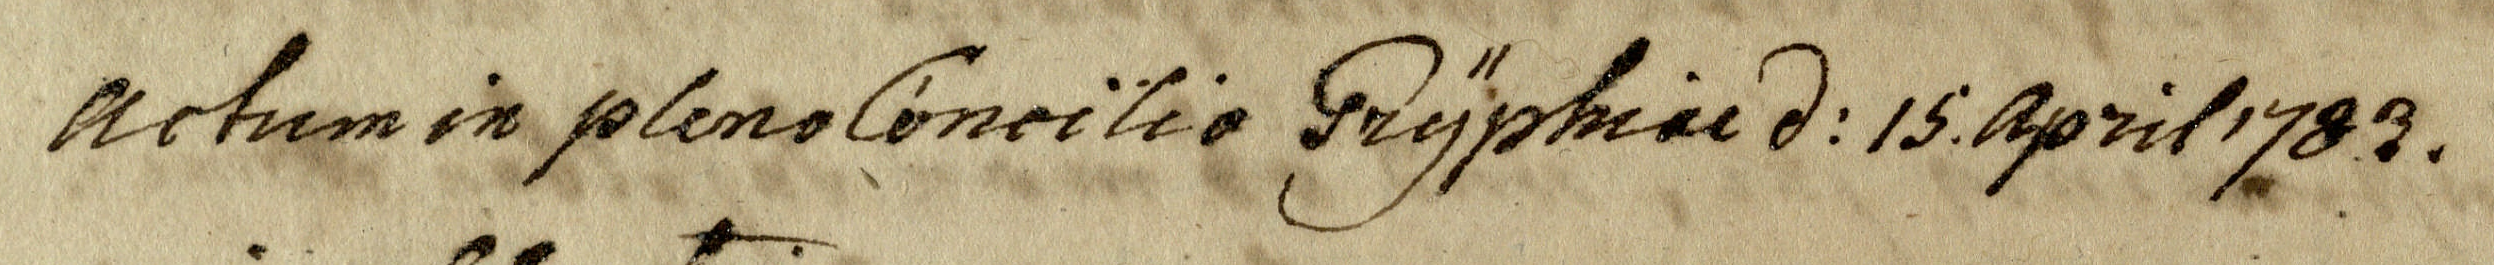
Actum in pleno Concilio Grÿphiae d. 15. April 1783.
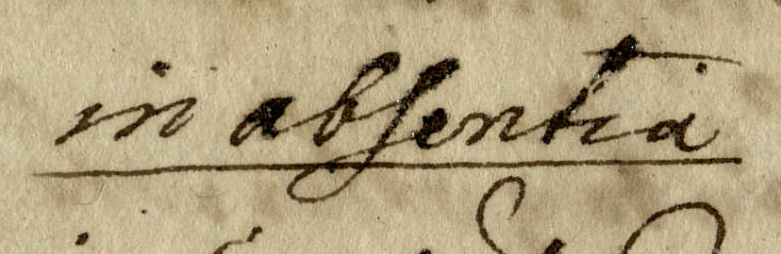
in absentia
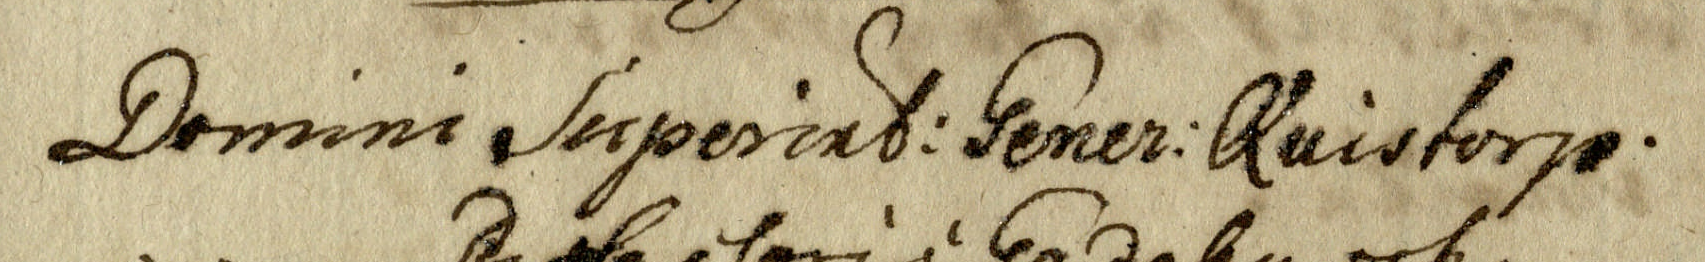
Domini Superint. Gener. Quistorp.
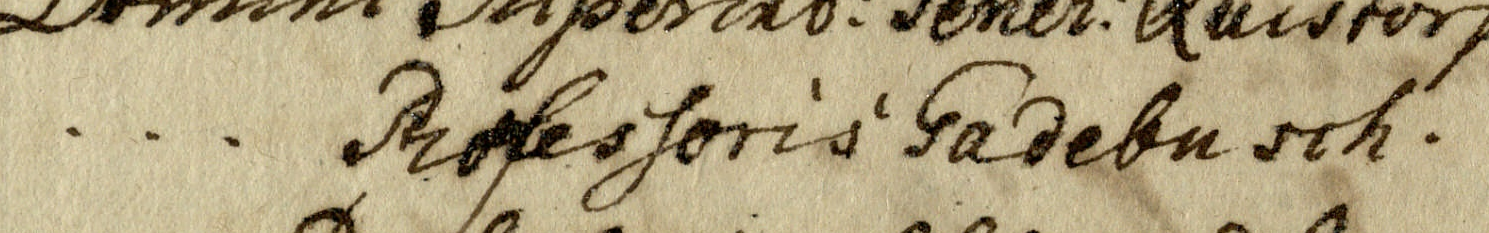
Professoris Gadebusch.
